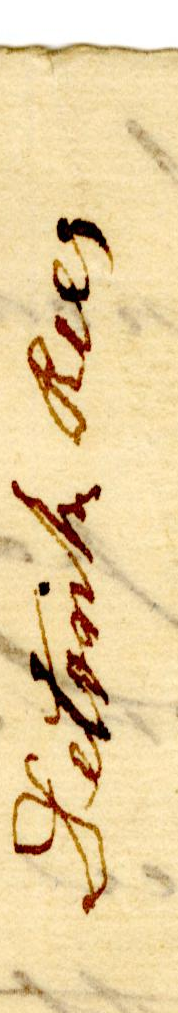Detrick Rees
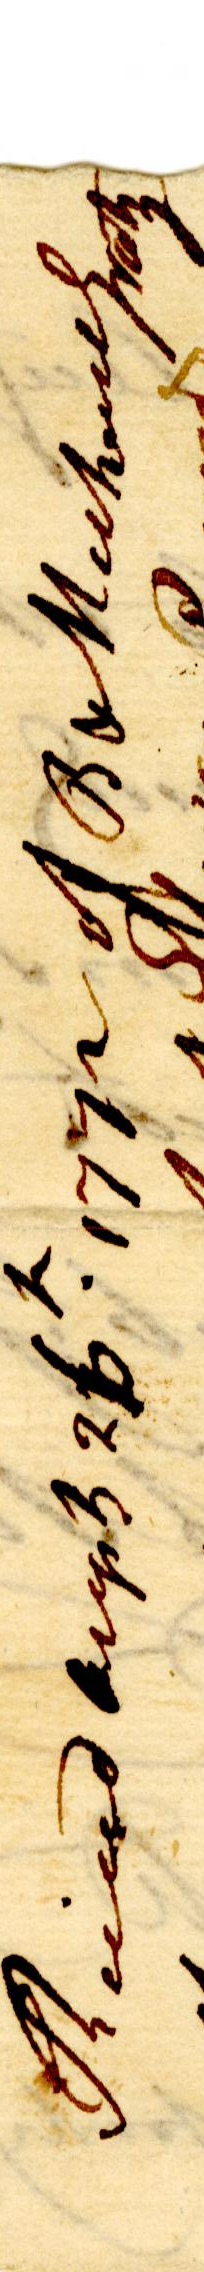Received aug^t 26^h. 1772 of B & Michael Gratz
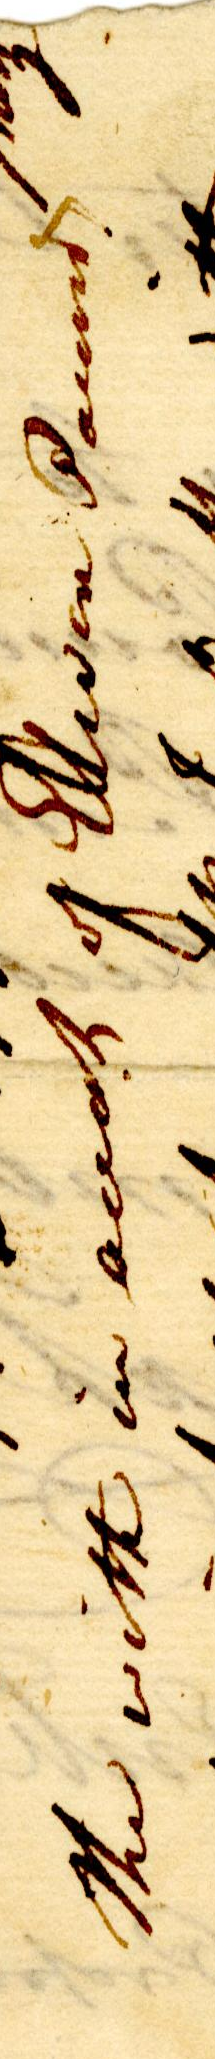the with in acco^t. of Eleven Pounds
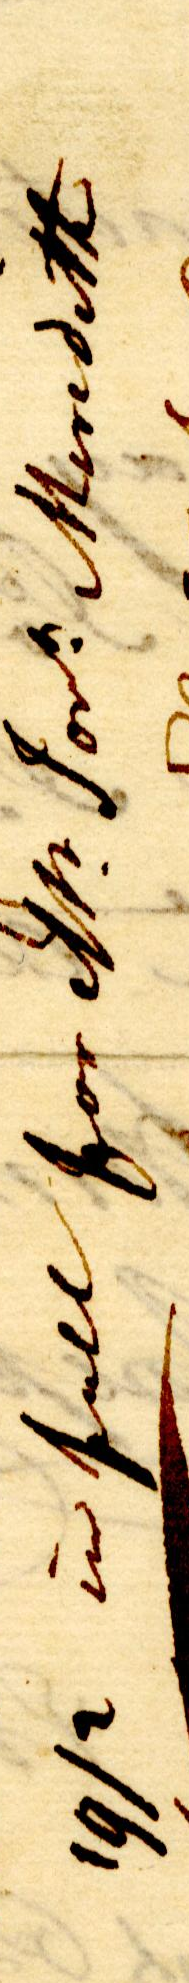19s2 in full for M^r. Jon^a. Meredith
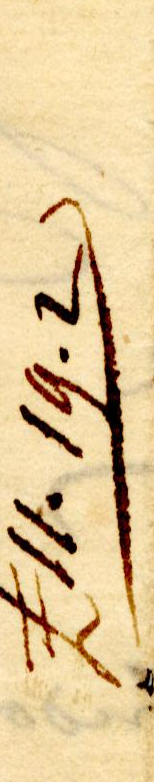£11.19.2
